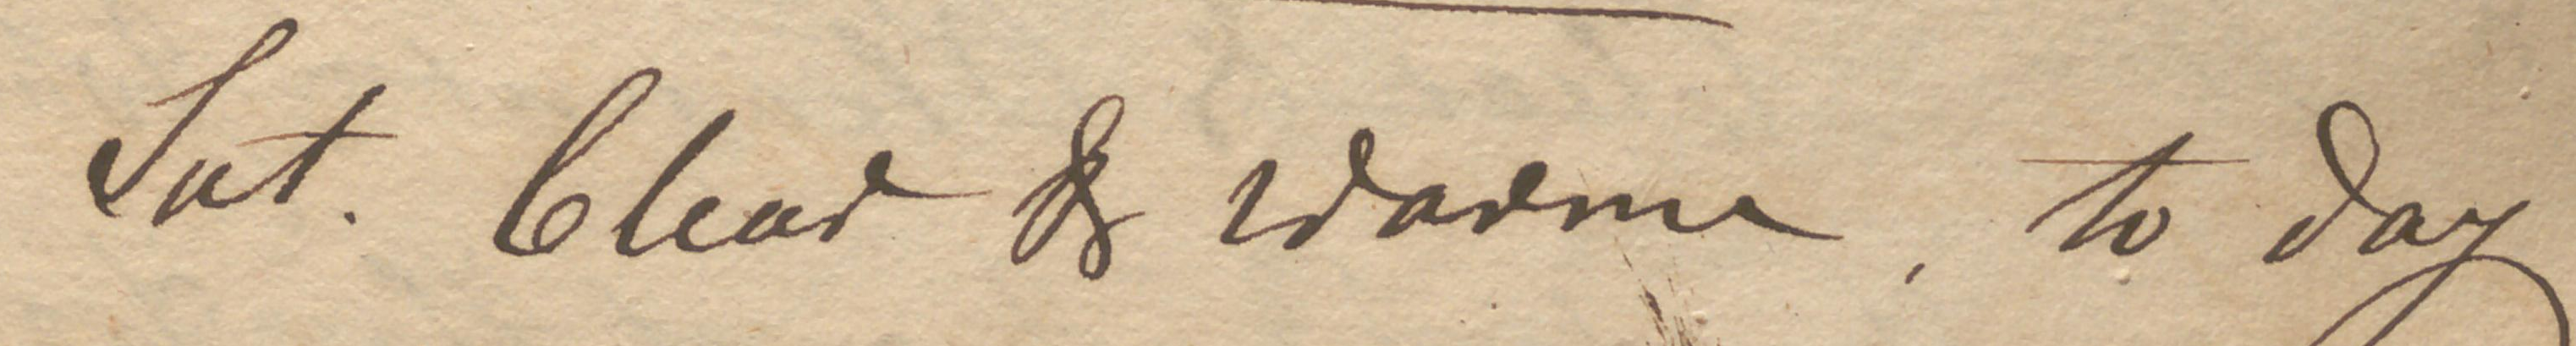Sat. Clear & Warme to day
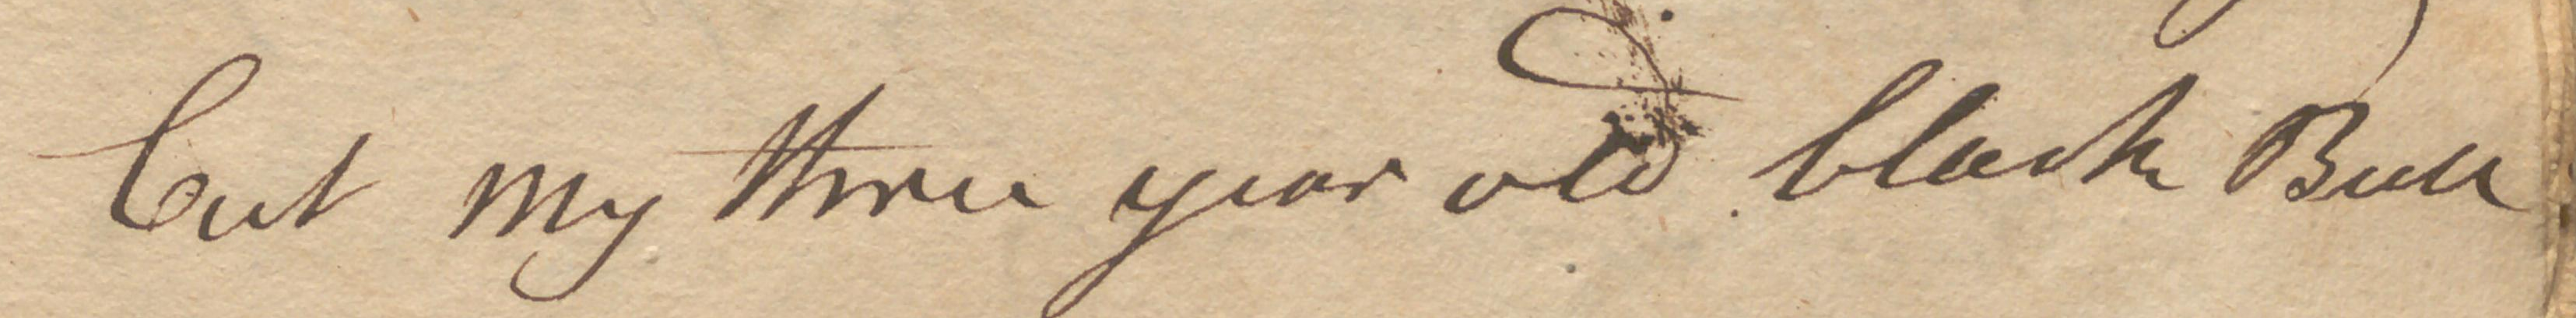Cut my three year old black Bull
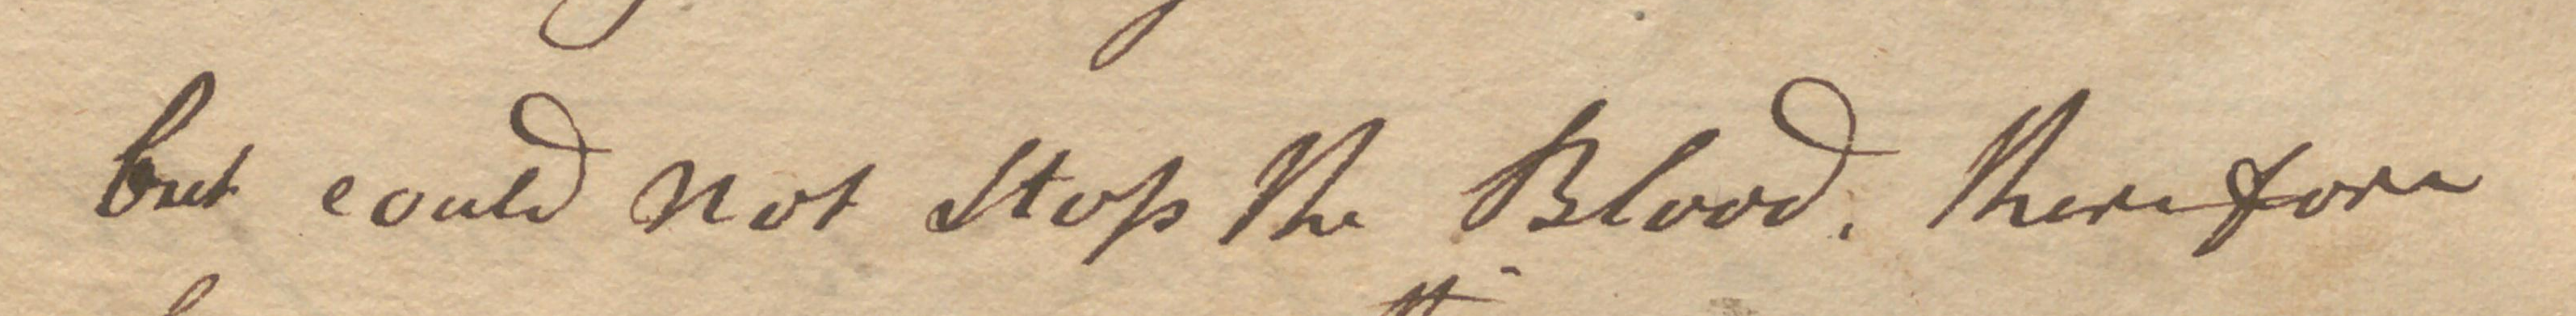but could not stop the Blood. there fore
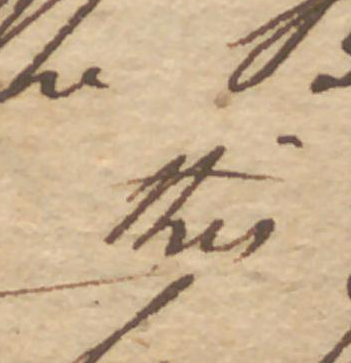this
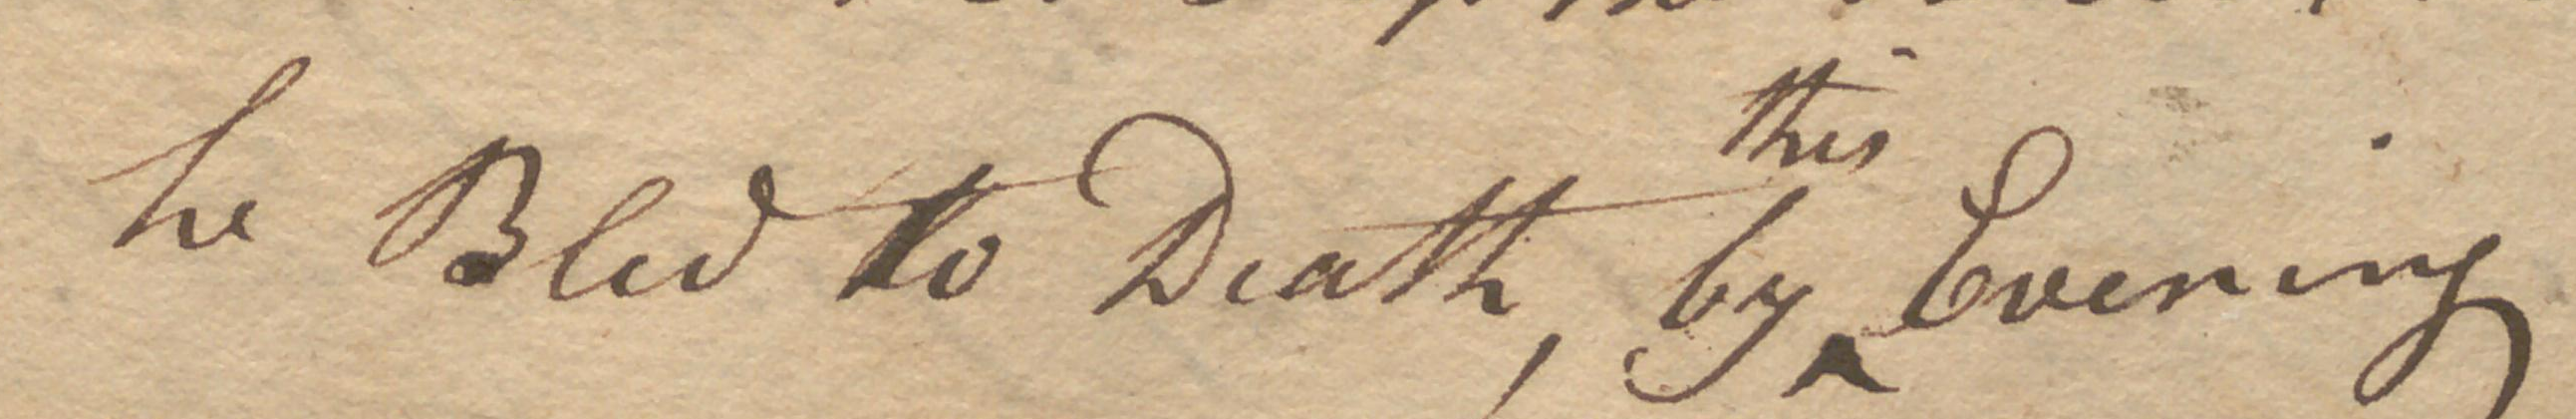he Bled to Death by ^ Evening
